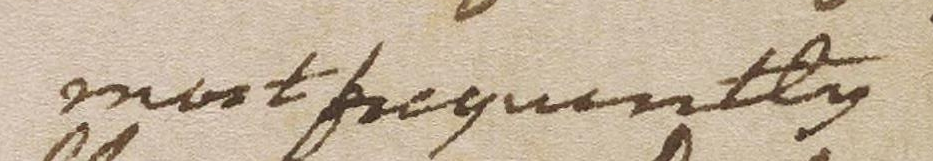most frequetly
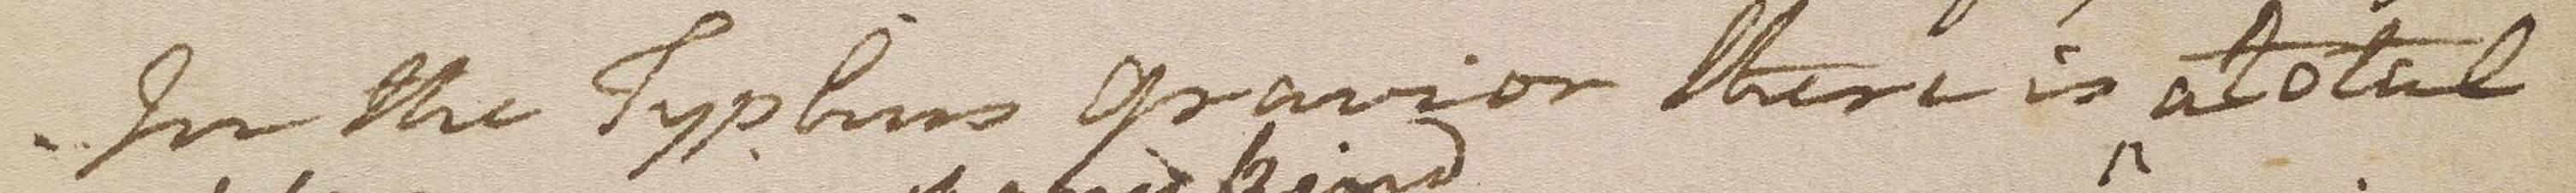In the Typhus Gravior there is ^ a total
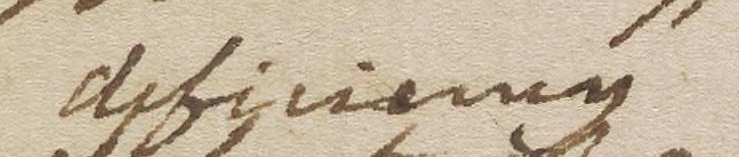deficiency
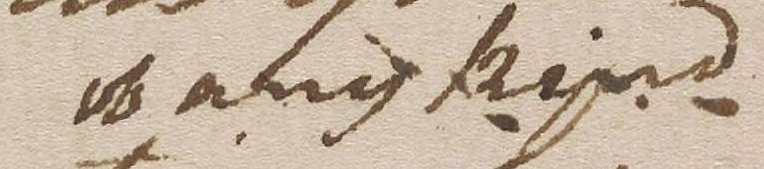of any kind
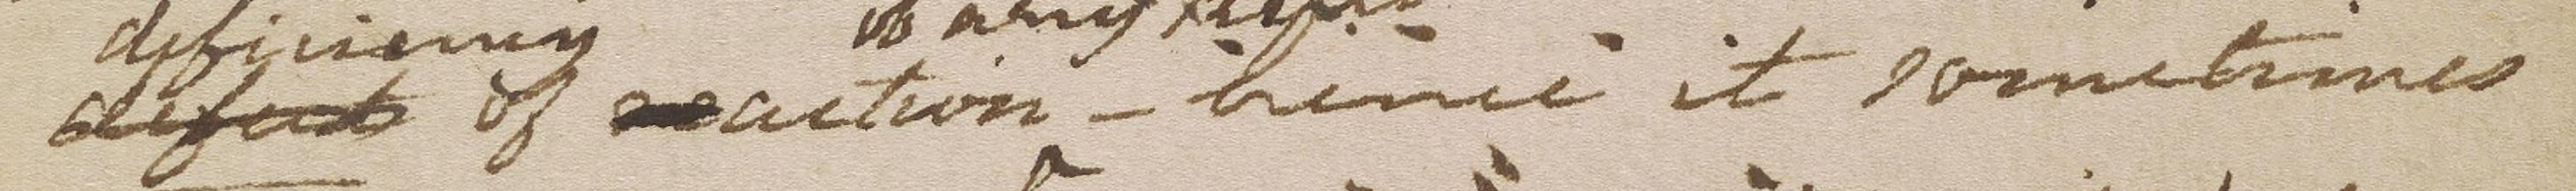[defect] of [re]action ^ hence it sometimes
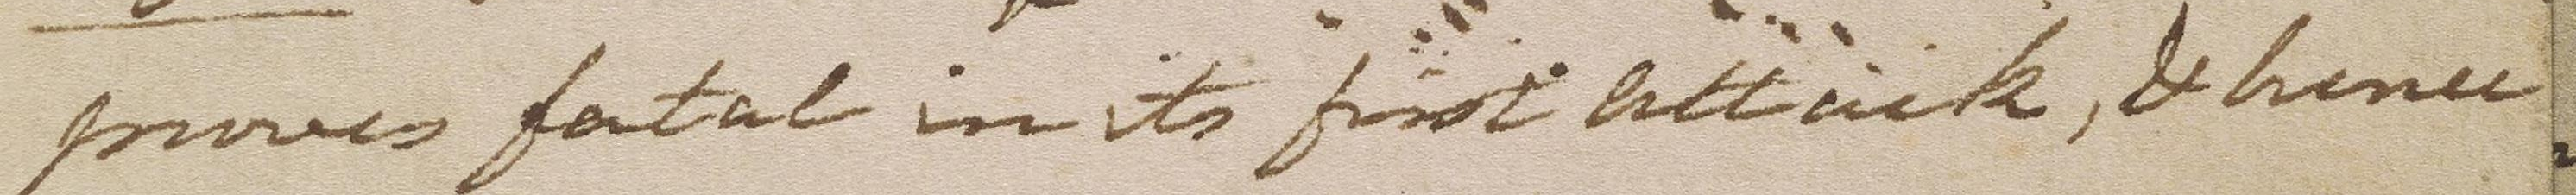proves fatal in its first attack, & hence
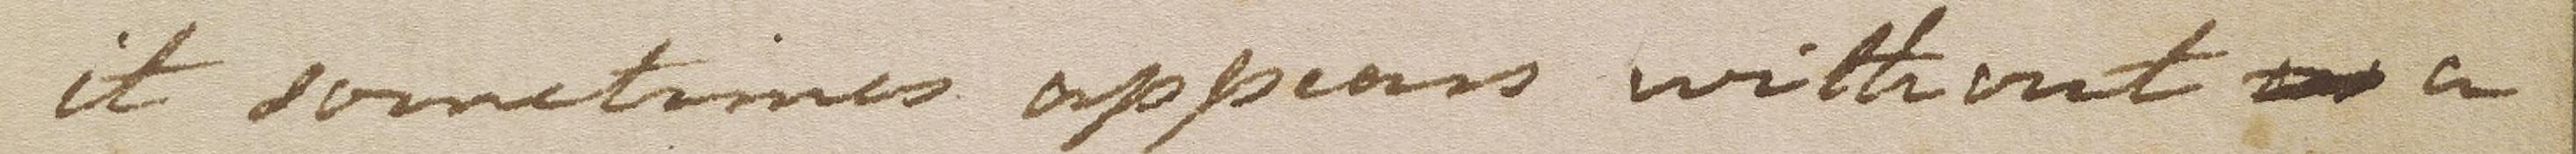it sometimes appears without [_] a
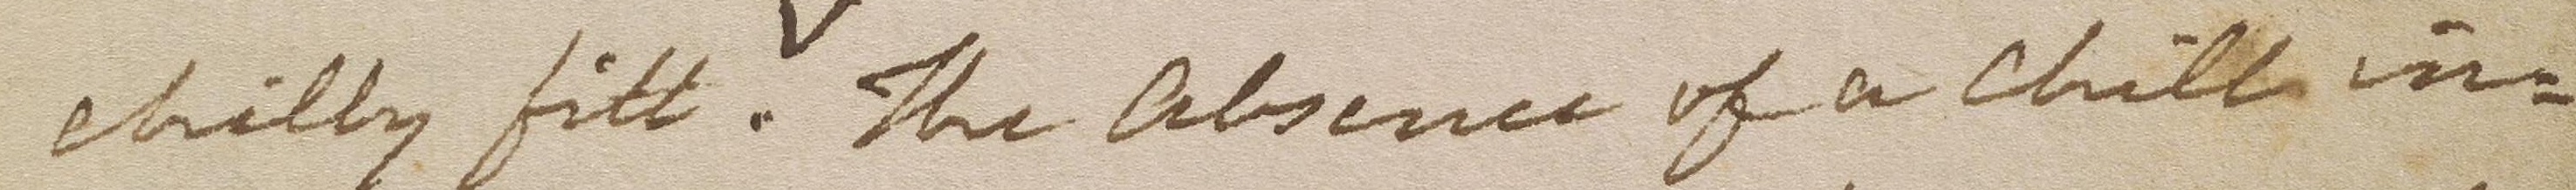chilly fitt. V The Absence of a chill in-
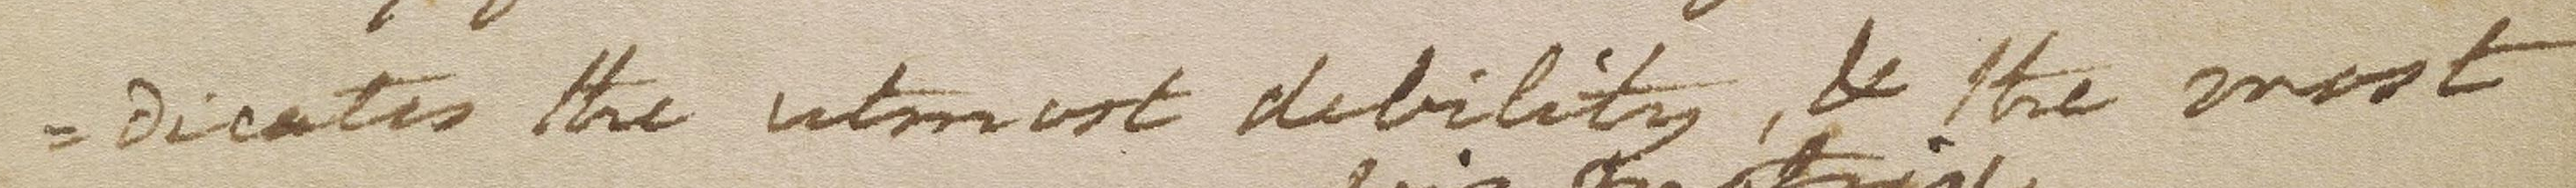-dicates the utmost debility, & the most
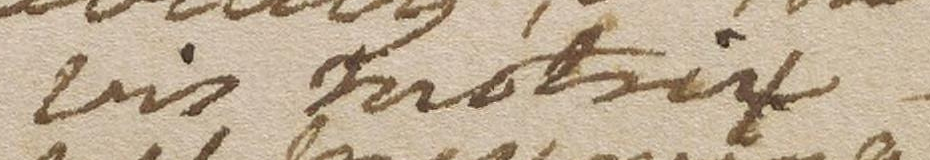vis motrix
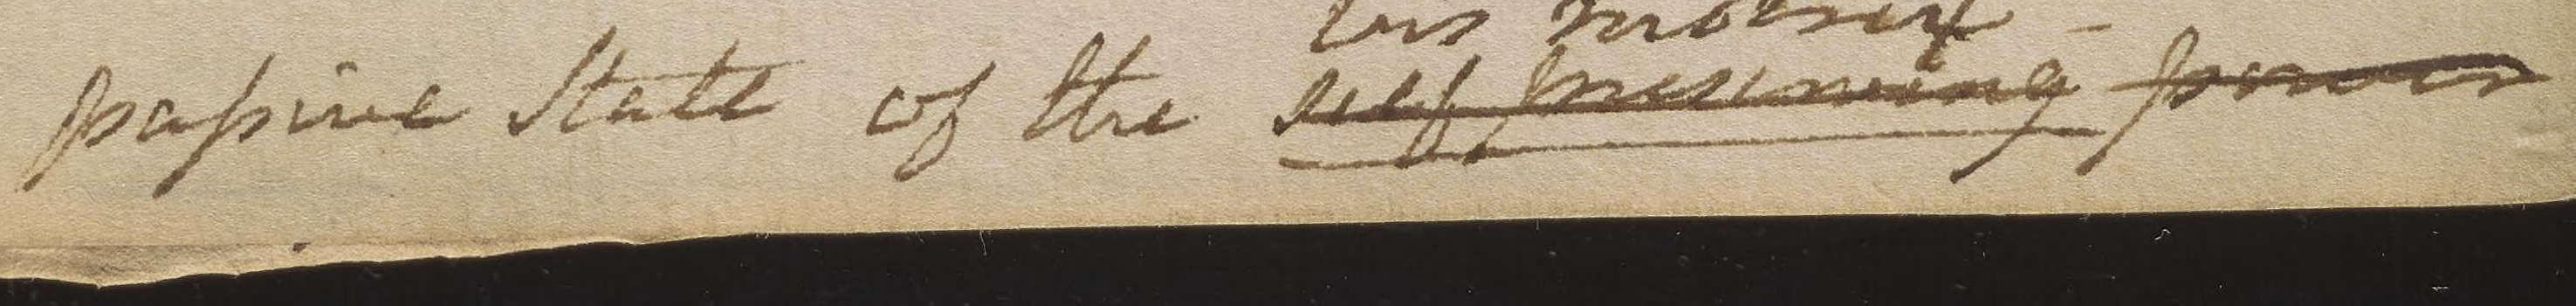passive state of the [self-preserving powers]
